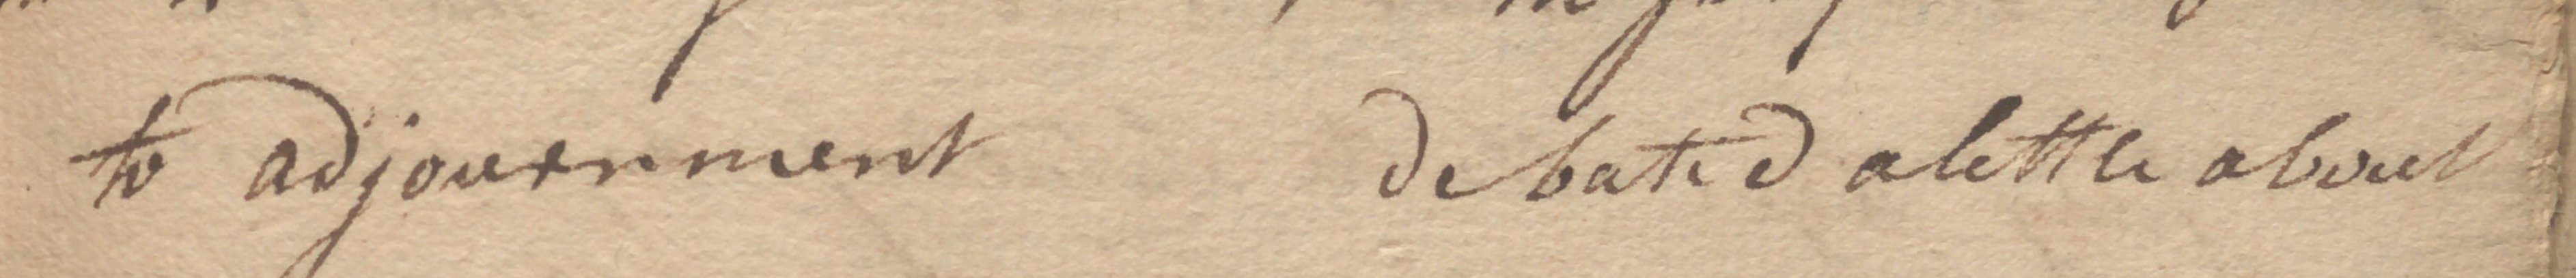to adjournment debated a little about
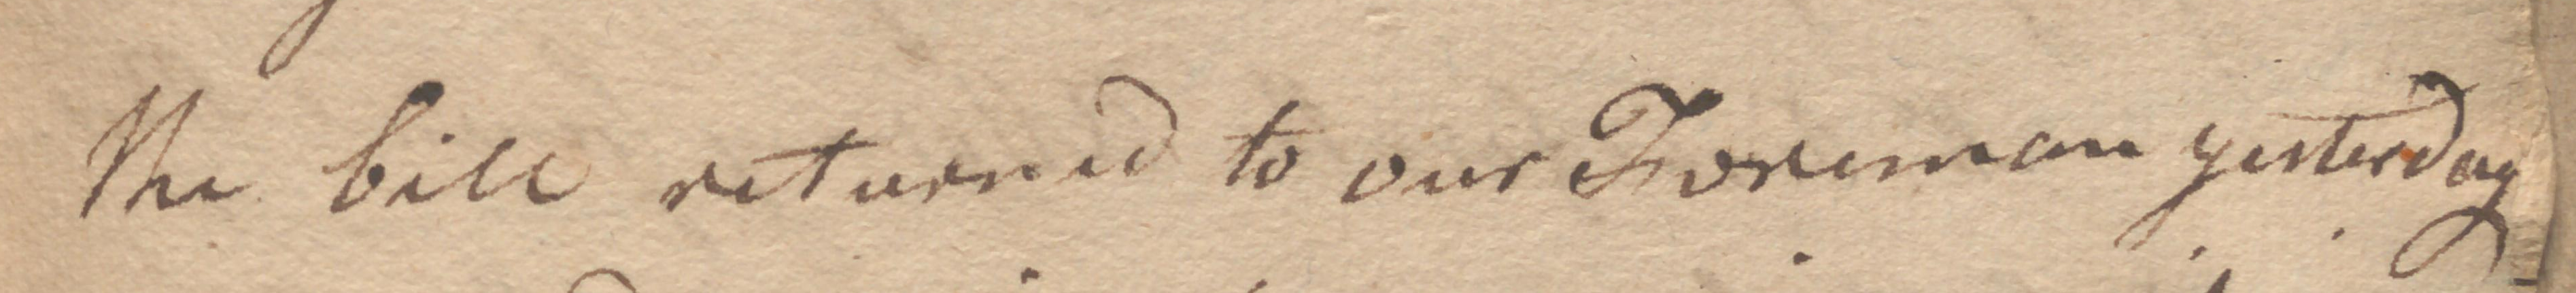the bill returned to our Foreman yesterday
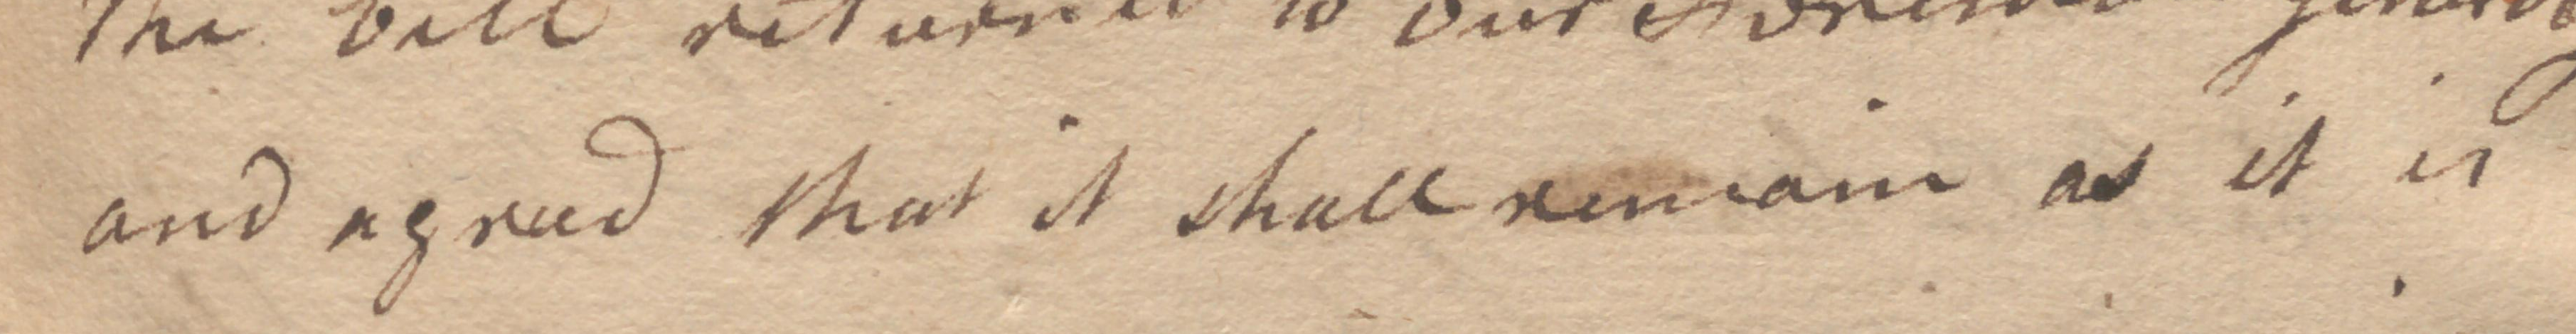and agreed that it shall remain as it is
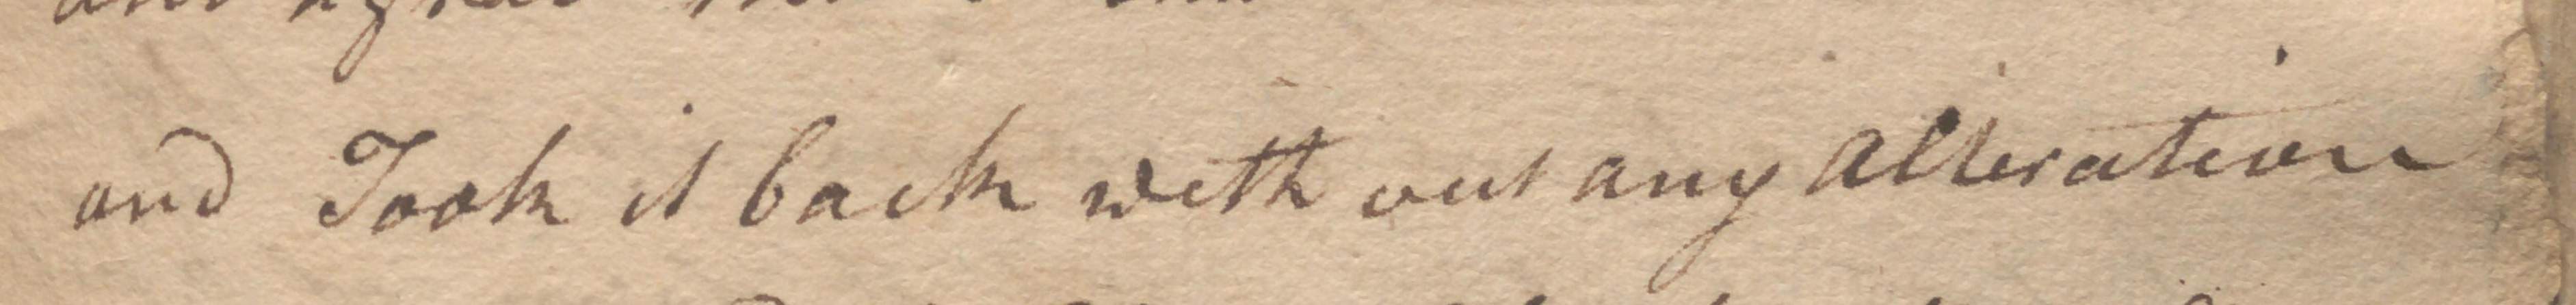and Took it back with out any Alteration
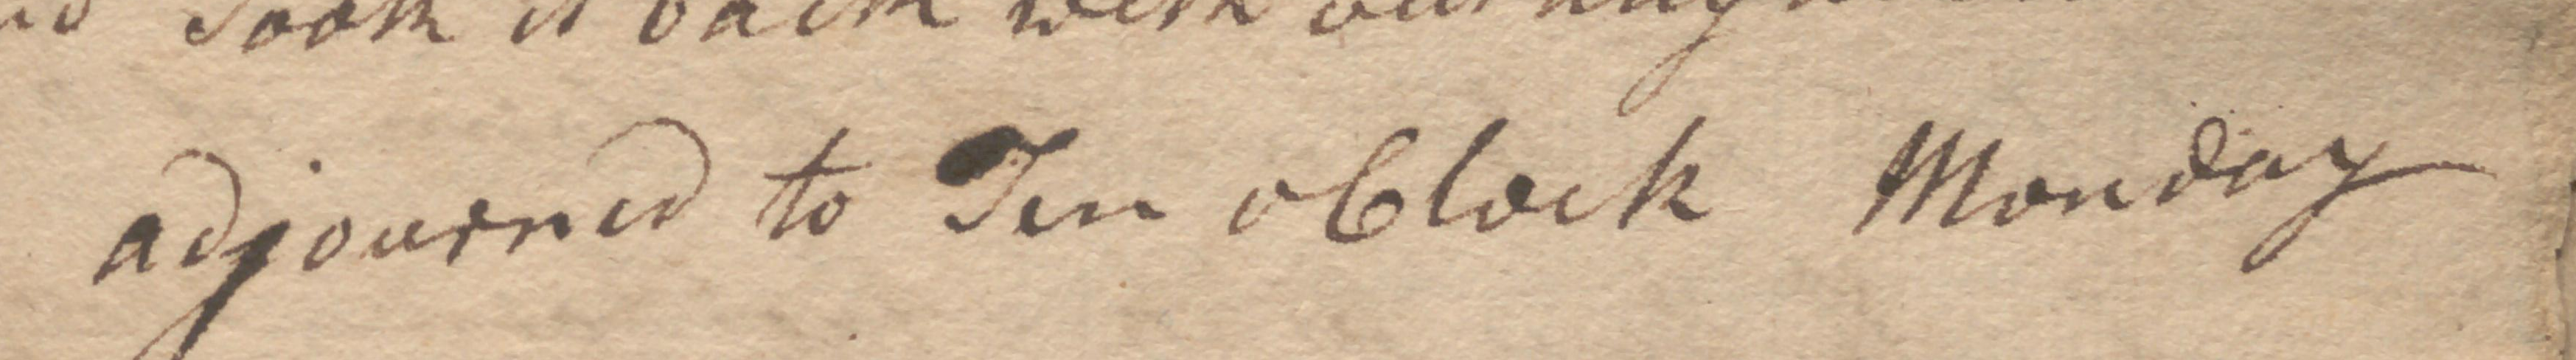adjourned to Ten oClock Monday
